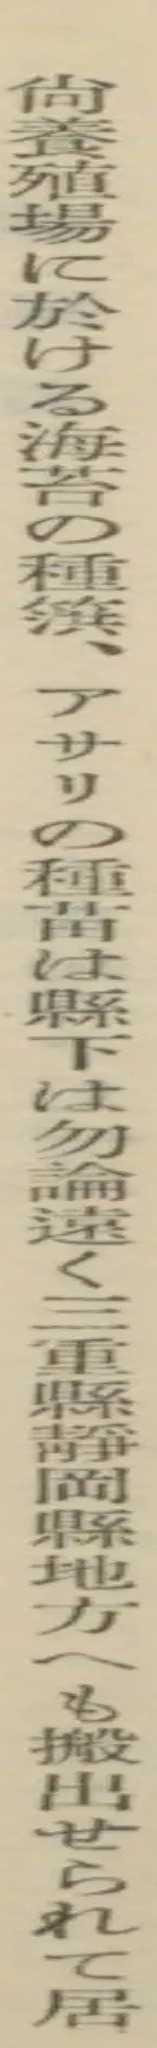尚養殖場に於ける海苔の種篊、アサリの種苗は県下は勿論遠く三重県静岡県地方へも搬出せられて居
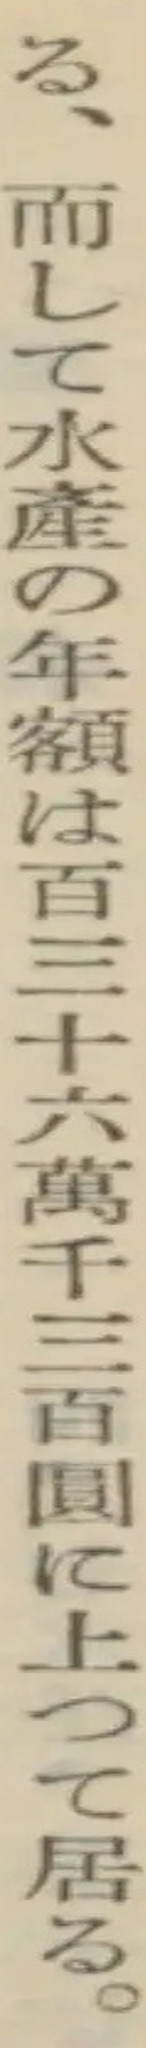る、而して水産の年額は百三十六万千三百円に上つて居る。
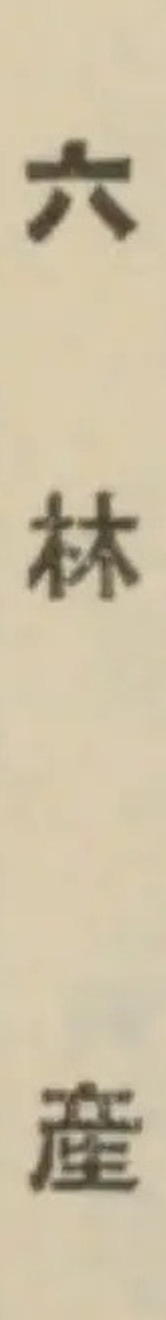六林産
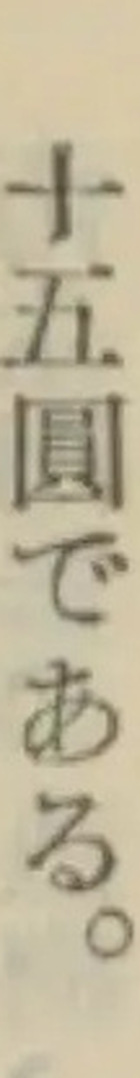十五円である。
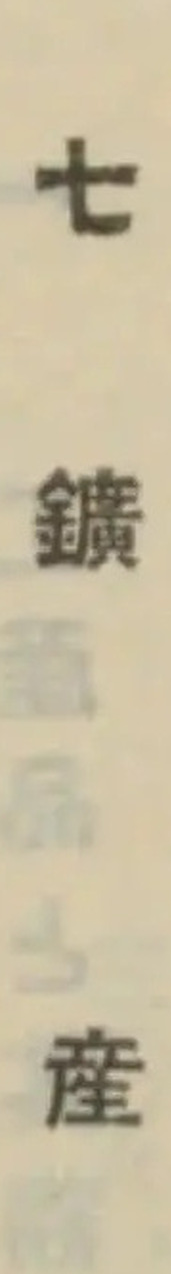七鉱産

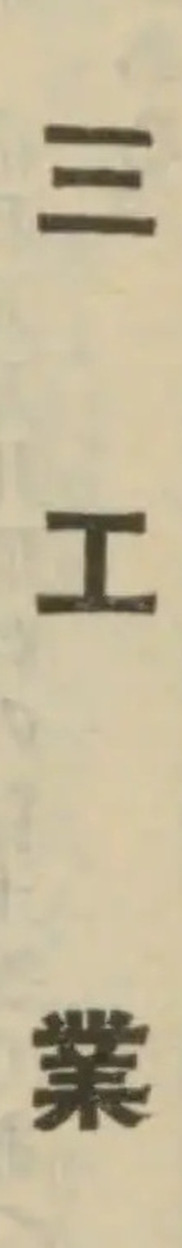三工業
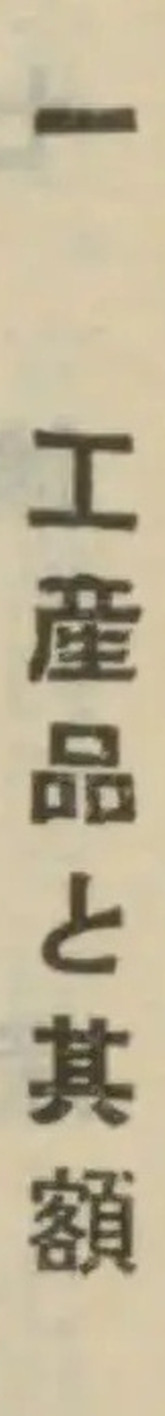一工産品と其額
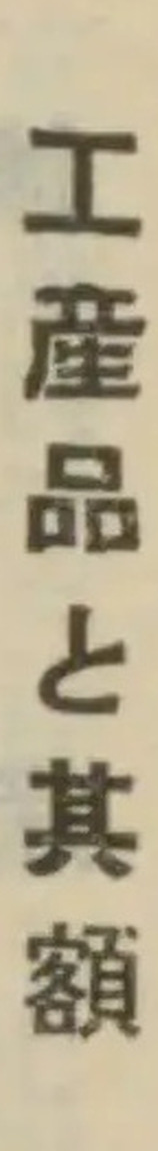一工産品と其額
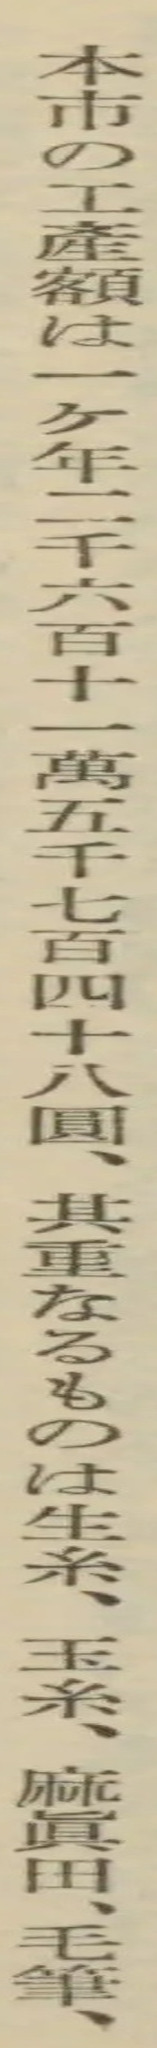本市の工産額は一ヶ年二千六百十一万五千七百四十八円、其重なるものは生糸、玉糸、麻真田、毛筆、
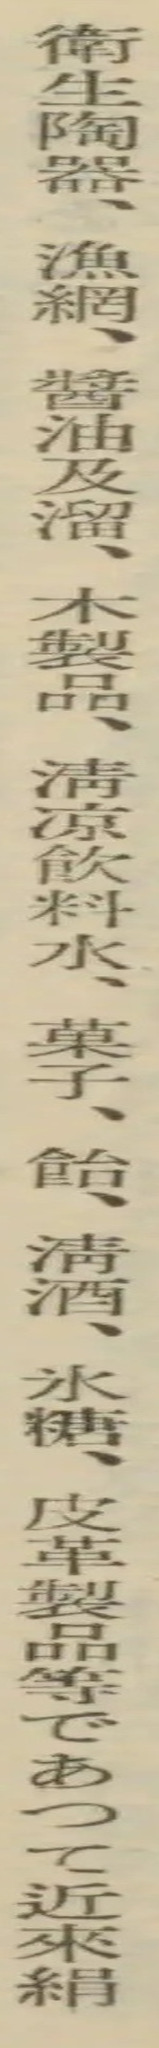衛生陶器、漁網、醤油及溜、木製品、清涼飲料水、菓子、飴、清酒、氷糖、皮革製品等であつて近来絹
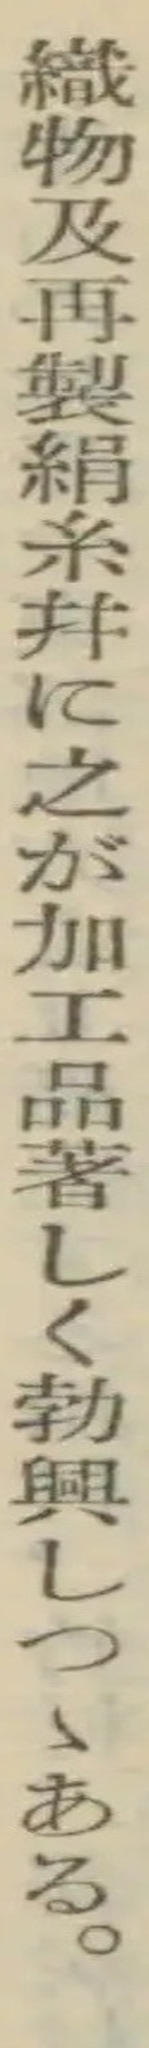織物及再製絹糸并に之が加工品著しく勃興しつゝある。
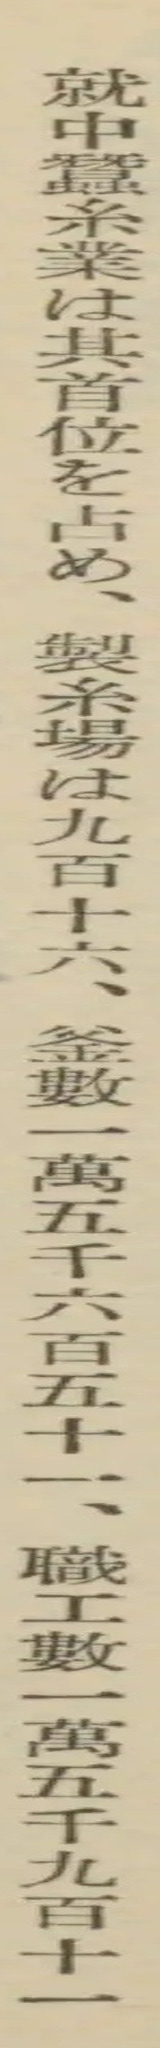就中蚕糸業は其首位を占め、製糸場は九百十六、釜数一万五千六百五十一、職工数一万五千九百十一
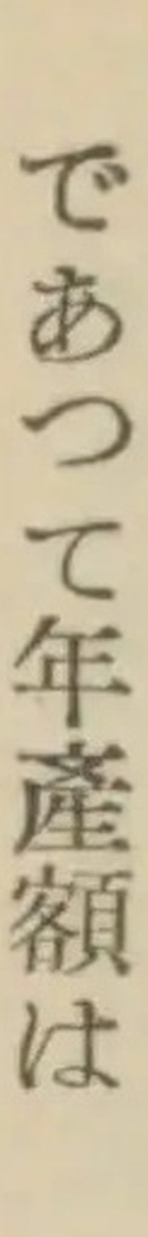であつて年産額は
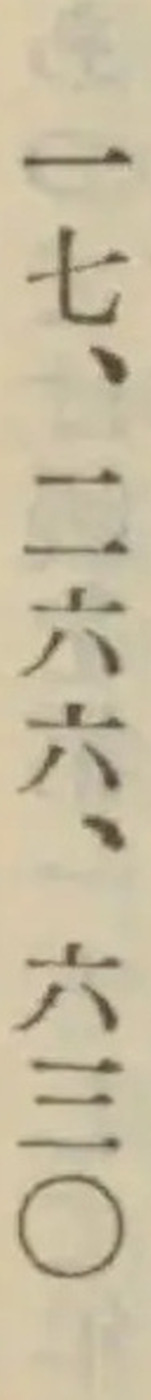計一七、二六六、六三〇
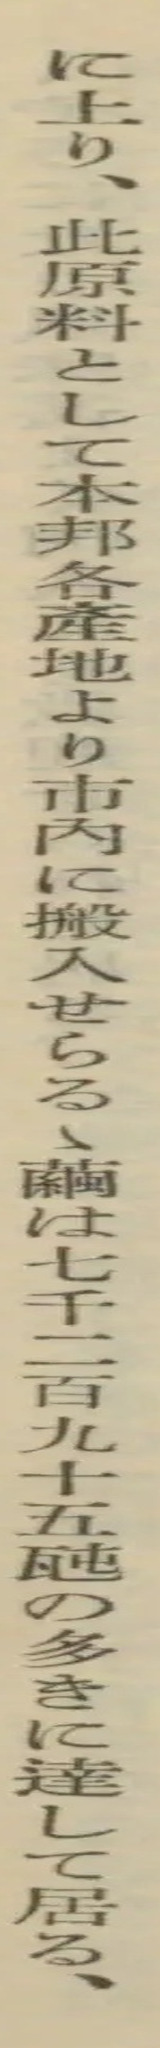に上り、此原料として本邦各産地より市内に搬入せらるゝ繭は七千二百九十五瓲の多きに達して居る、
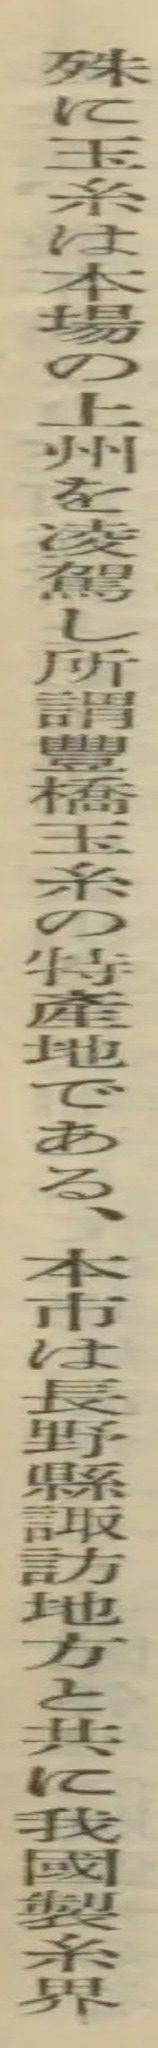殊に玉糸は本場の上州を凌駕し所謂豊橋玉糸の特産地である、本市は長野県諏訪地方と共に我国製糸界
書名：産業の豊橋
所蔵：国立国会図書館 National Diet Library, JAPAN
